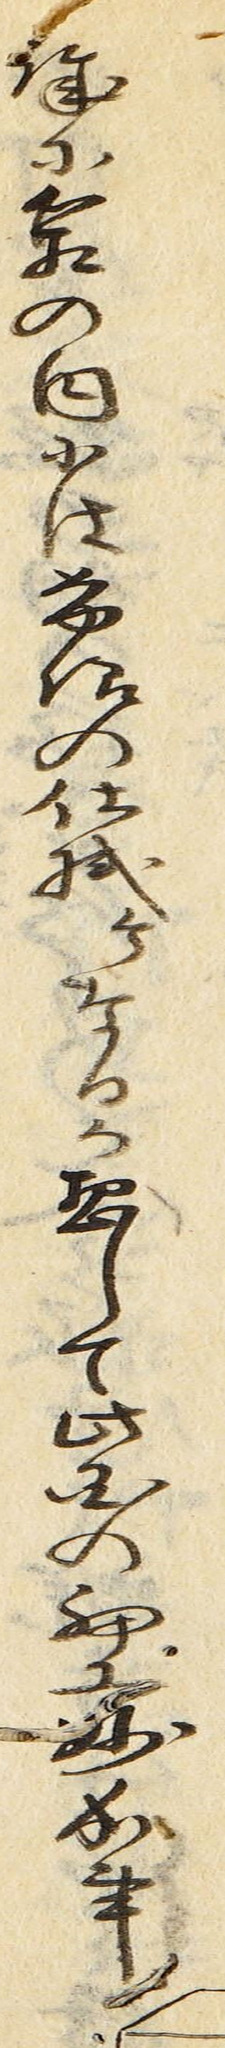誠に箱の内には如何様の仕掛ヶなるか惣して此国の細工妙成事
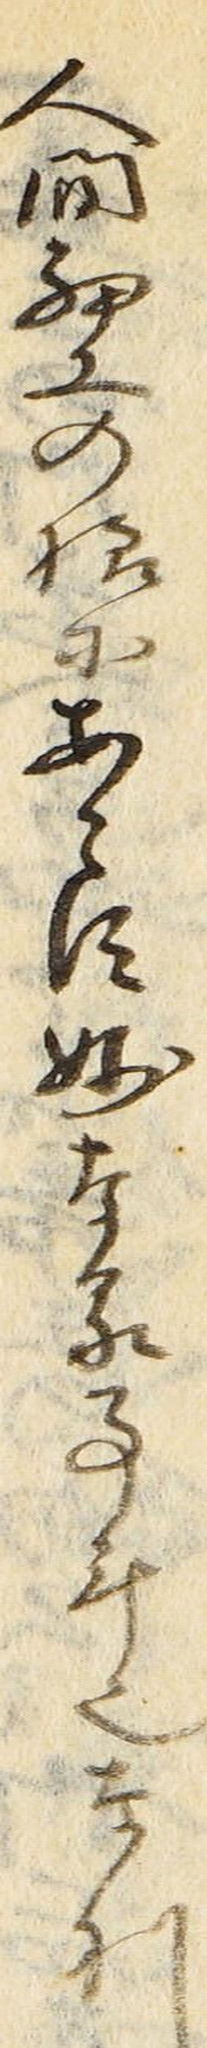人間細工の様にあらす妙なる事計也なり
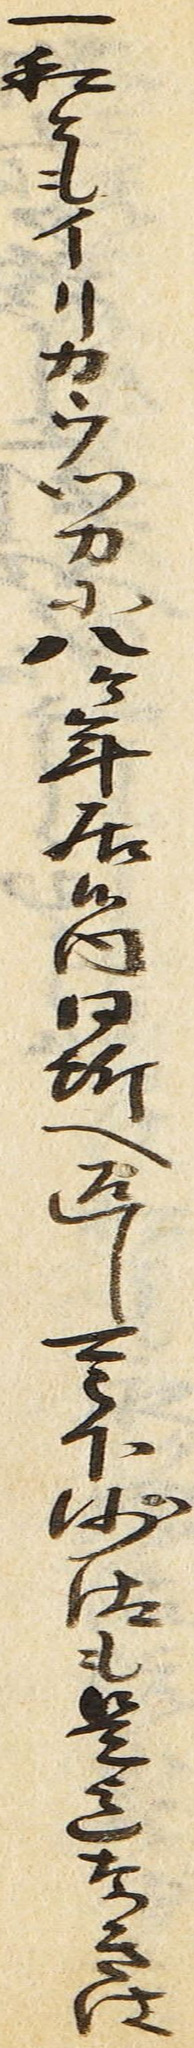一私ともイリカウツカに八ヶ年居候内同所へ返し可被下沙汰も是迄なきは
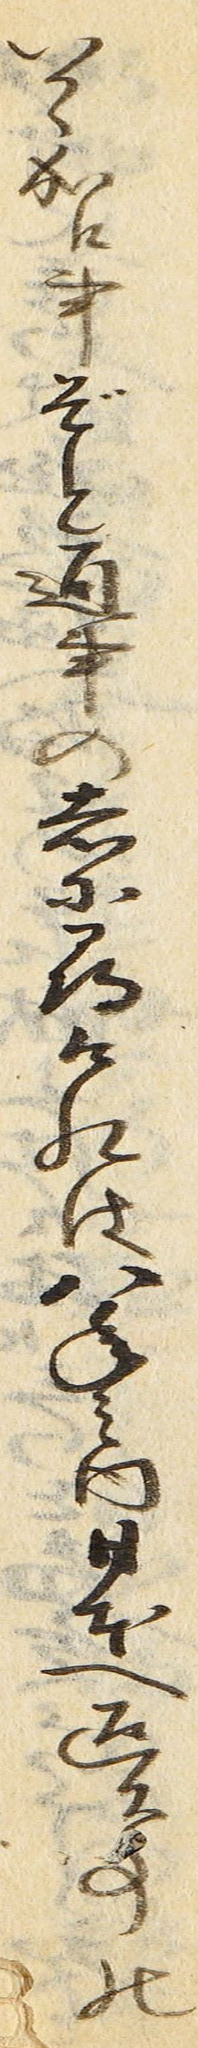いか成る事ぞと通事の者にた尋けれは八年之内日本へ返す事の
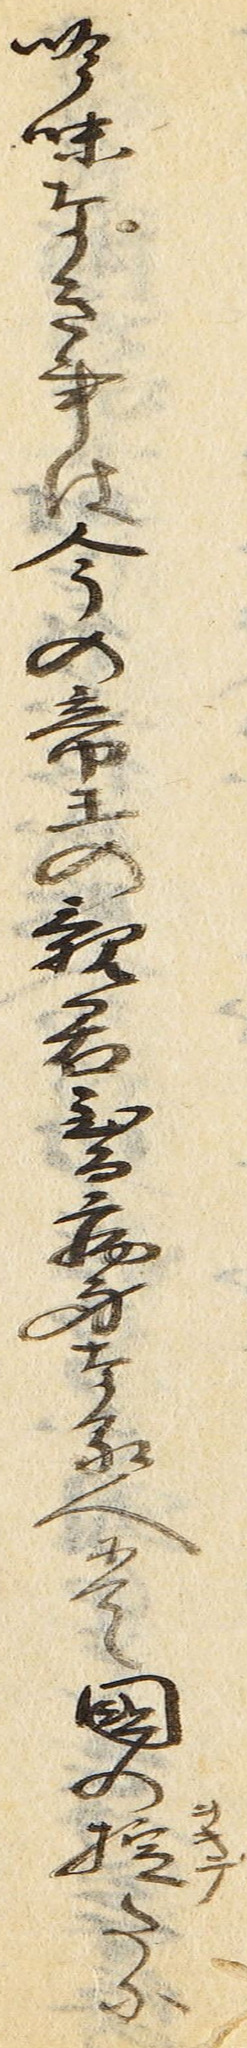吟味なき事は今の帝王の親君至而病身なる人にて国の掟たに
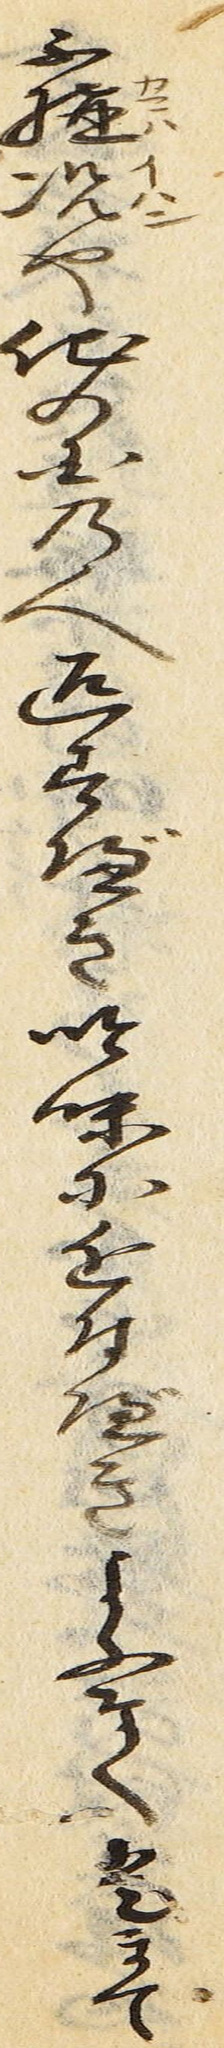不構況や他の国の人返すべき吟味に近付べきよふなく是まて
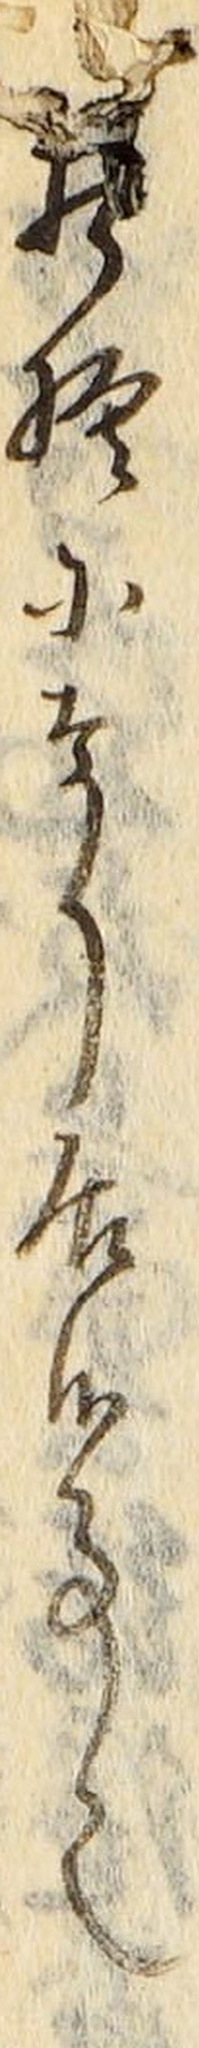相捨になり居候事也
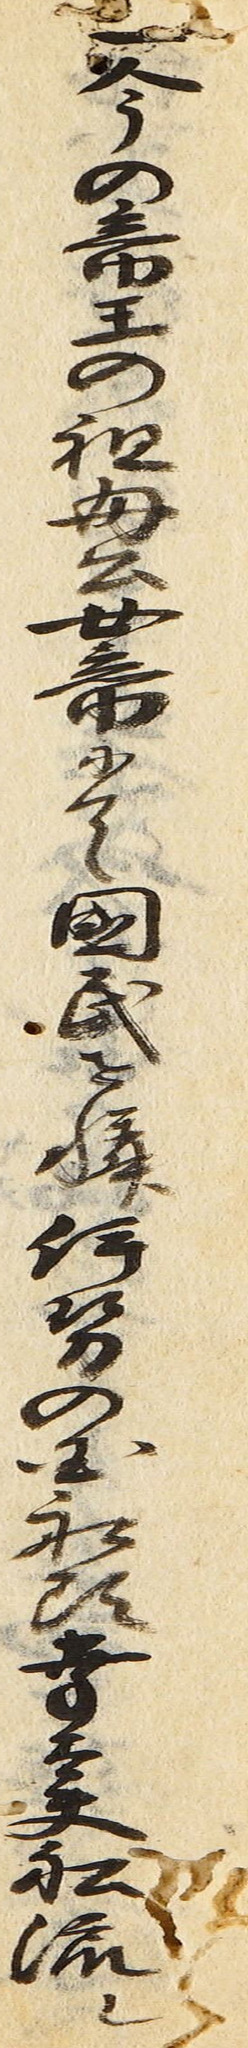一今の帝王の祖母公女帝にて国民を憐伊勢の国船頭幸太夫船流し
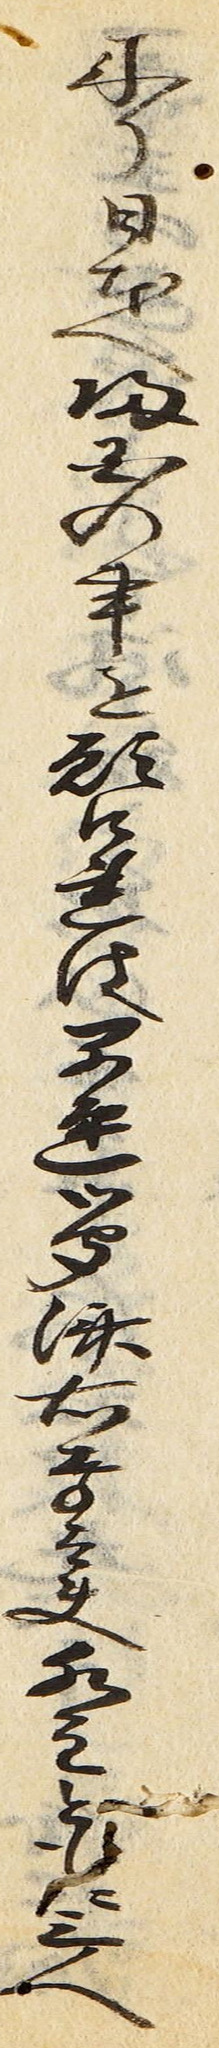来り日本へ帰国の事を願けれは早速御聞済右幸太夫水主ともに三人
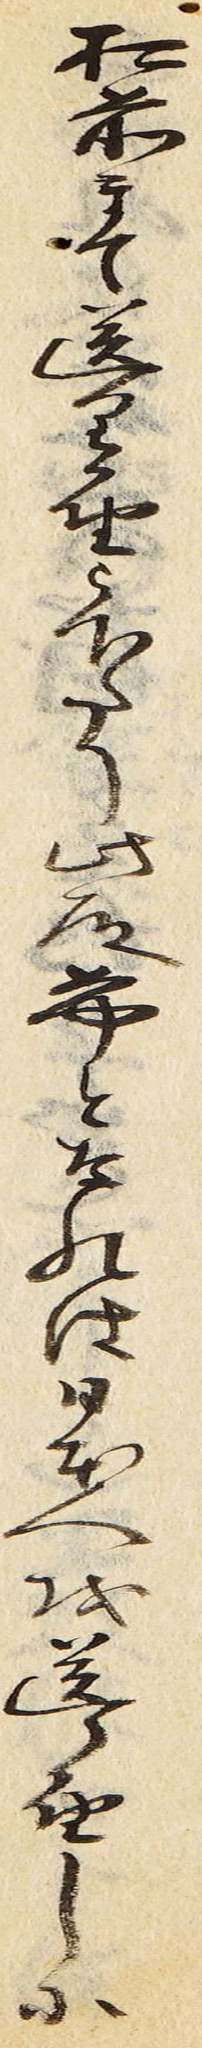松前まて送り届被下たり此故如何となれは日本人を送り届しに
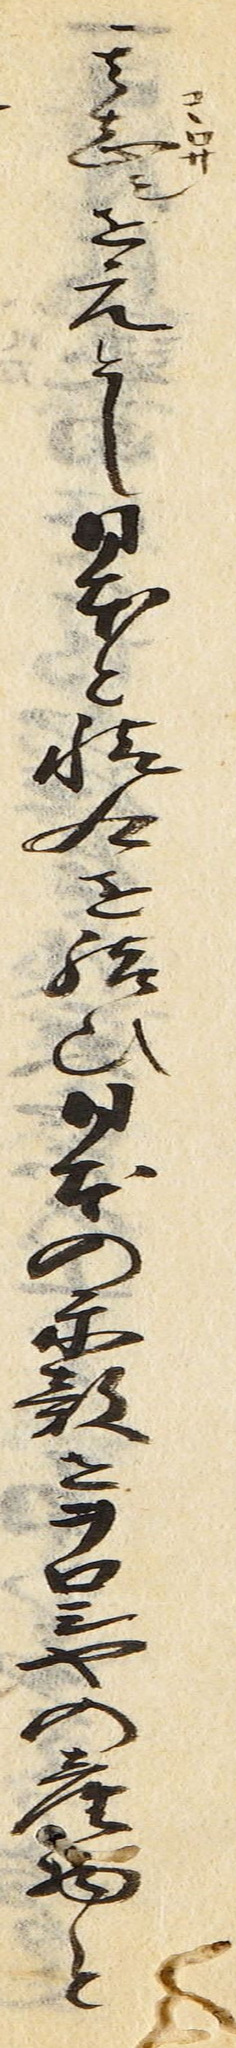其志しを元とし日本と情合を結ひ日本の米穀をヲロシヤのさ産物と
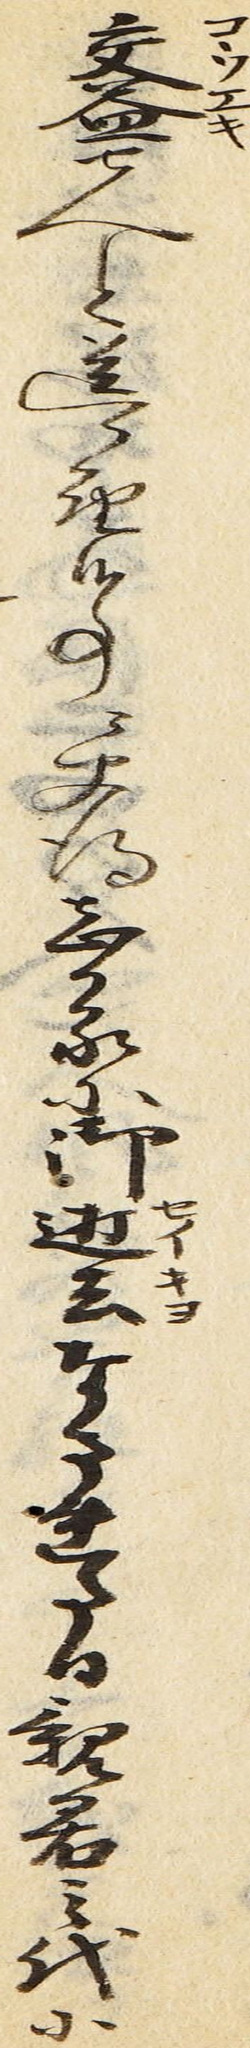交益せんと送り届候事に聞得しかるに御逝去なされたる親君之代に
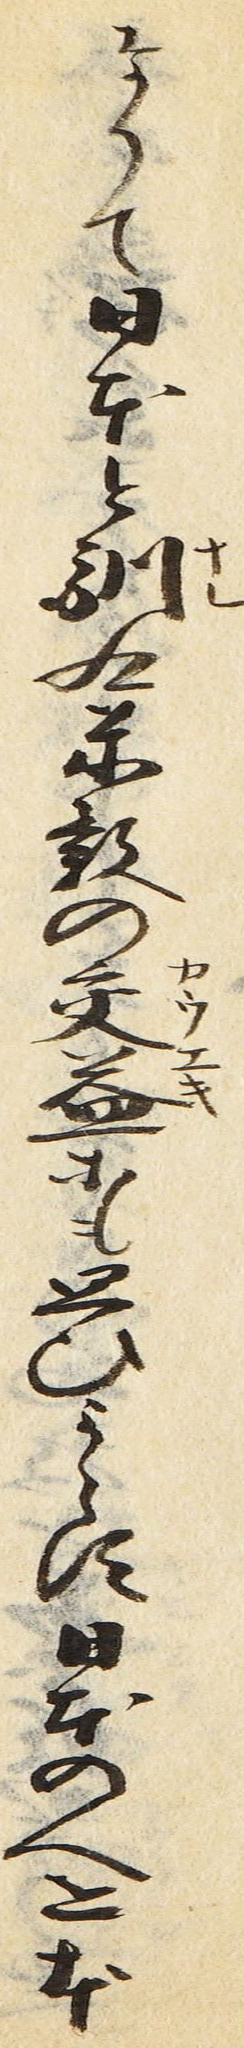なりて日本と馴合米穀の交益等も思ひよらす日本の人を本
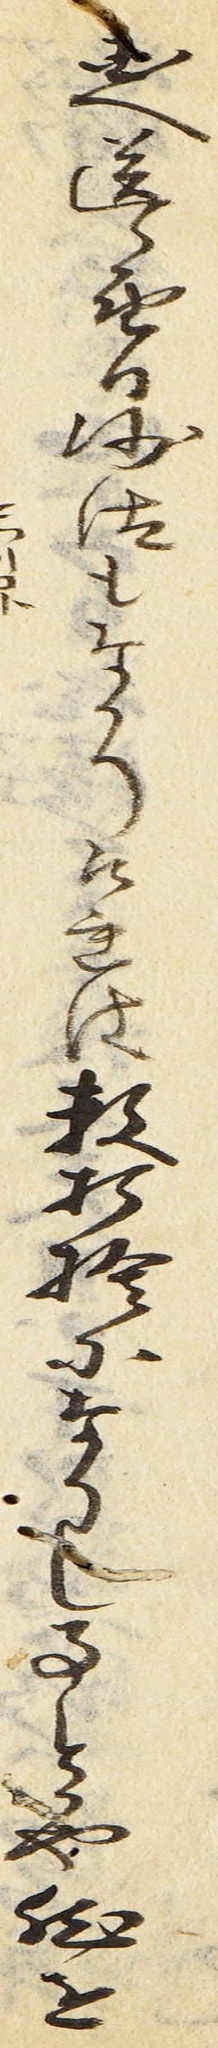国へ送り届る沙汰もなかりけれは頼打捨になりし事とかや然を
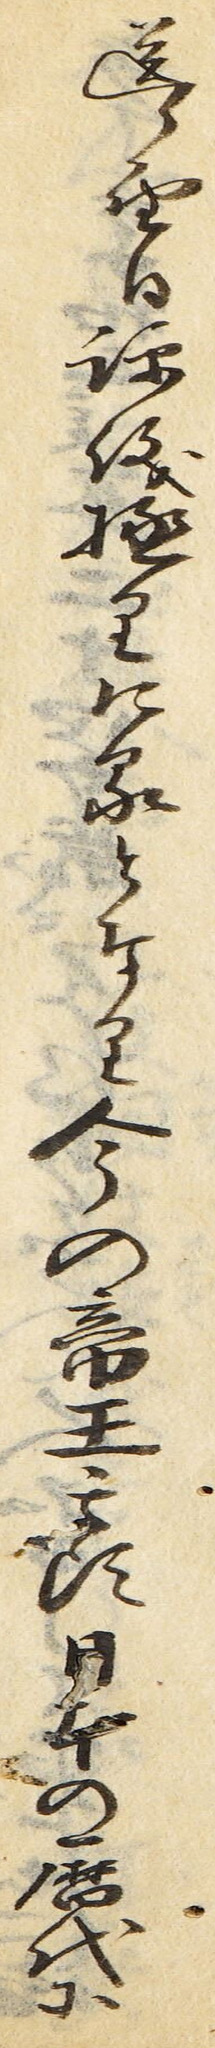送り届る評議極りけるとなり今の帝王其頃日本の歴代に

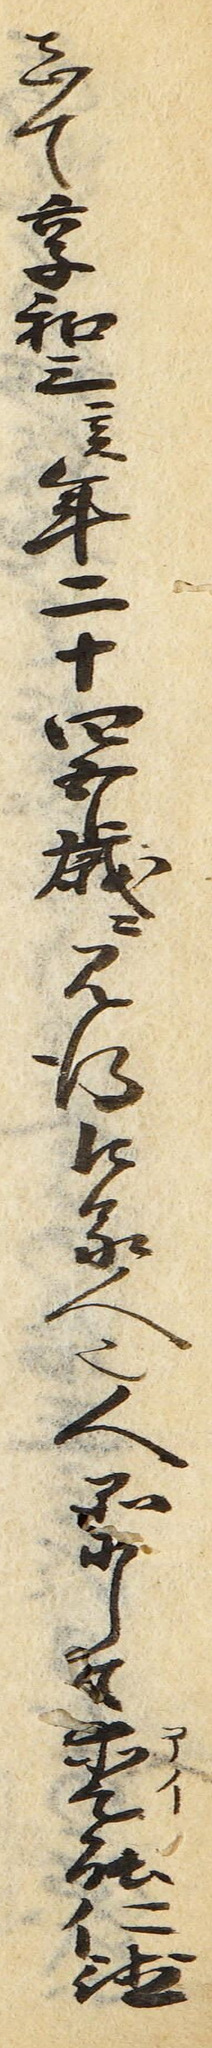して享和三亥年二十四五歳に見得ける人也人品にして愛能仁徳
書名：外国漂流記
